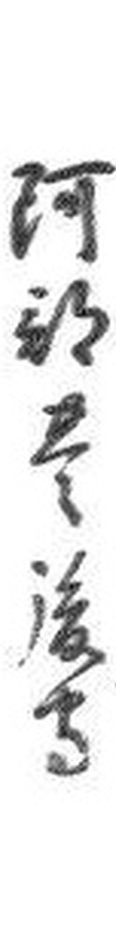阿部豊後守
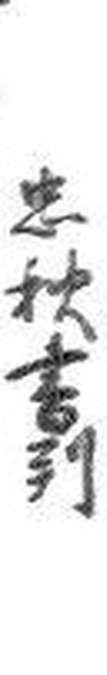忠秋書判
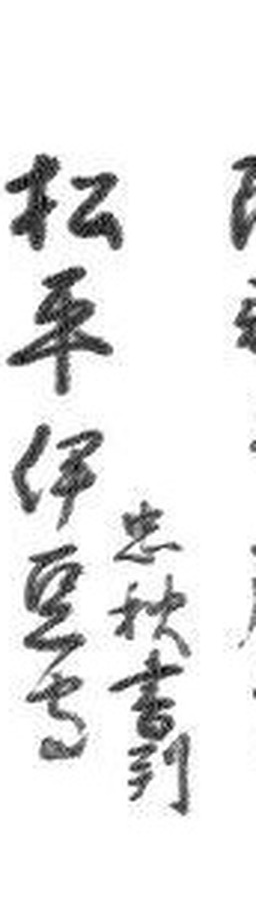松平伊豆守
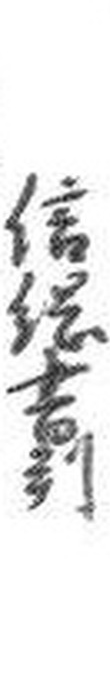信綱書判
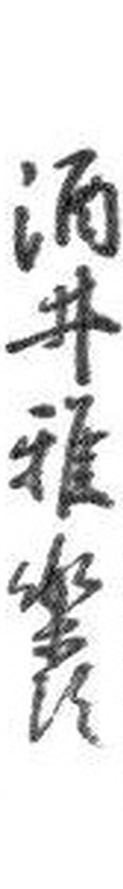酒井雅樂頭
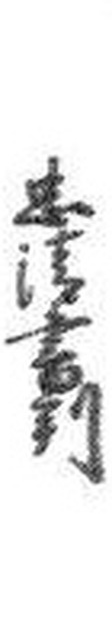忠清書判
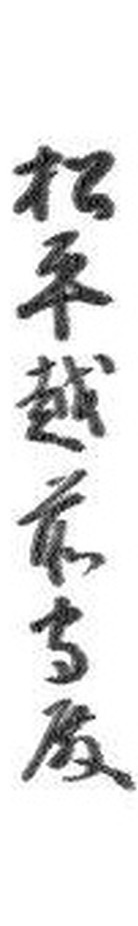松平越前守殿
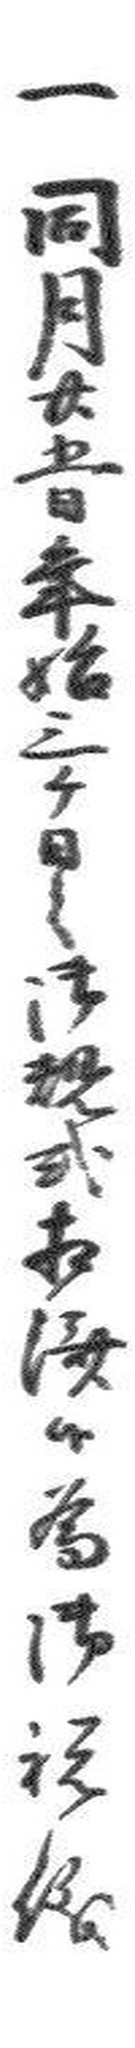一同月廿五日年始三ケ日之御規式相済候為御祝儀
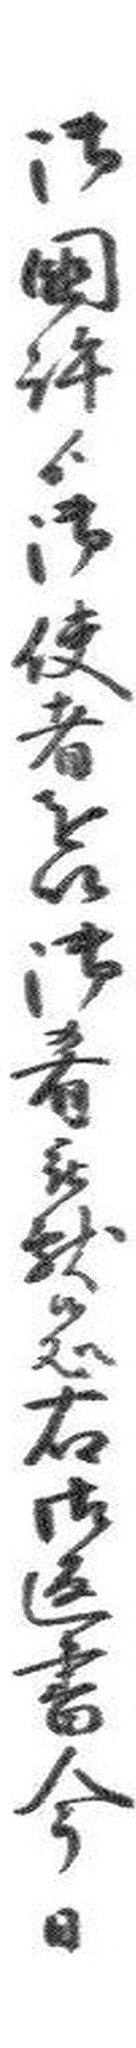御国許ゟ御使者を以御肴被献候処右御返書今日

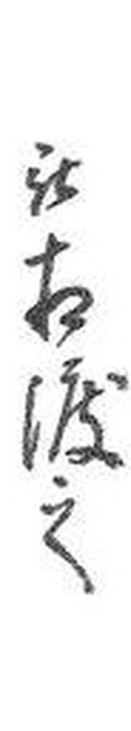被相渡之
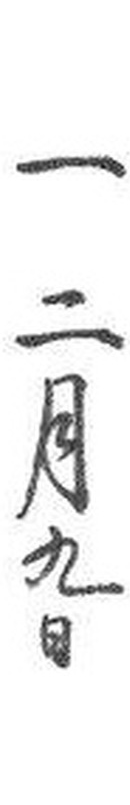一二月九日
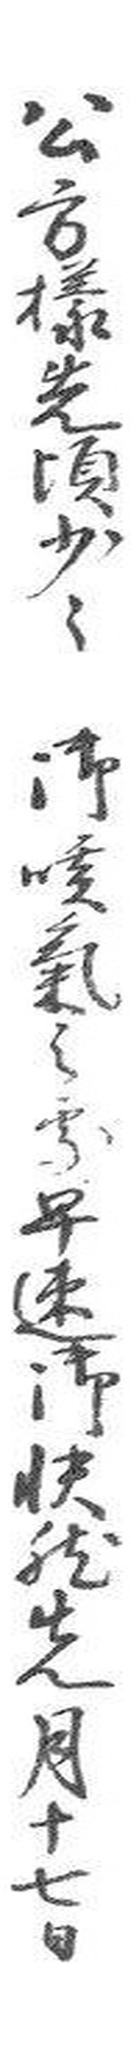公方様先頃少々御咳気之処早速御快然先月十七日
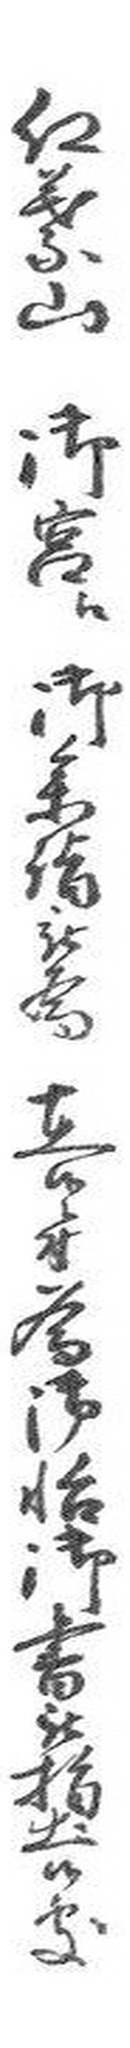紅葉山御宮江御参詣被為在候ニ付為御怡御書被指出候処
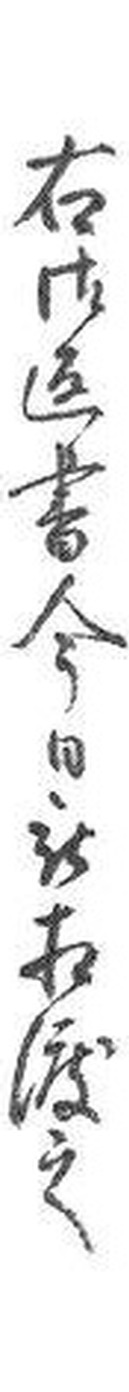右御返書今日被相渡之
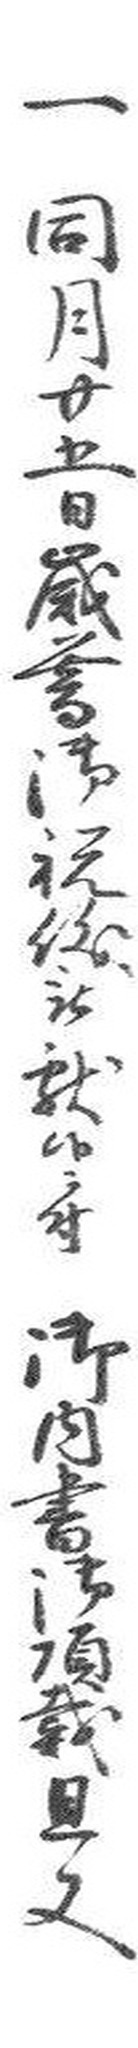一同月廿五日歳暮御祝儀被献候ニ付御内書御頂戴且又
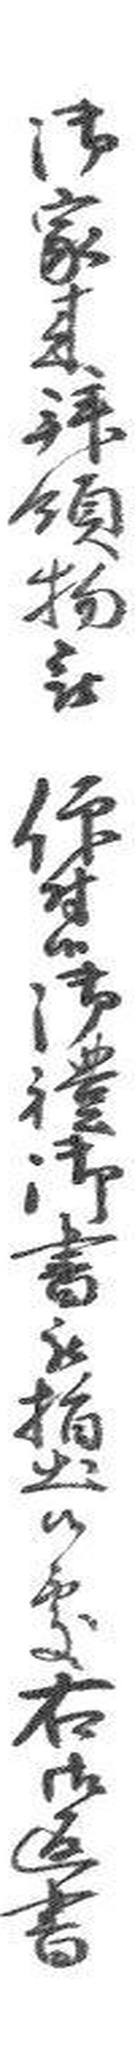御家来拝領物被仰付候御礼御書被指出候処右御返書
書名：家譜 六 光通公 従万治三年到寛文三年
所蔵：福井県文書館 Fukui Prefectural Archives
